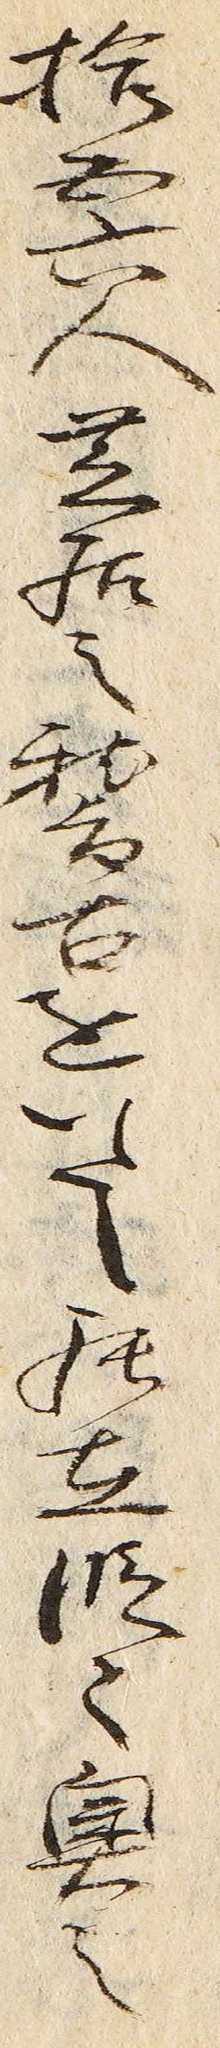拾五六人芝居之稽古をいたし罷在段々奥之
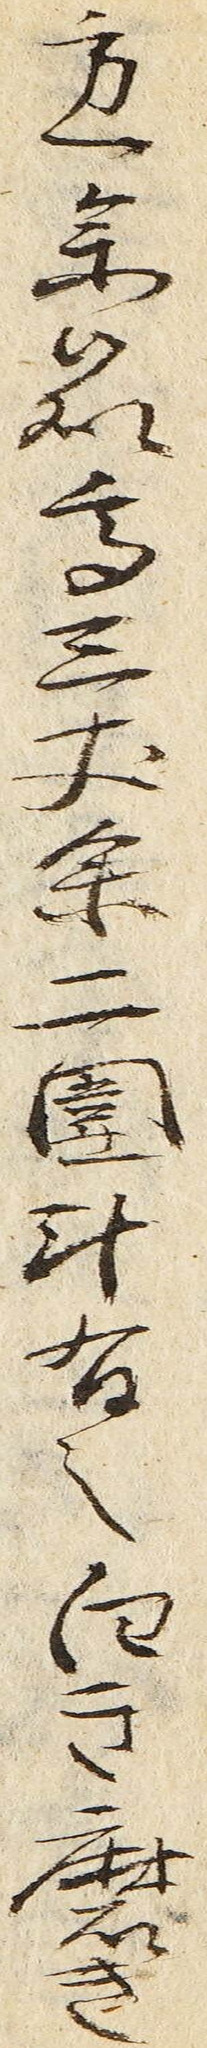方へ参候処高三丈余二囲斗有之白き磨き
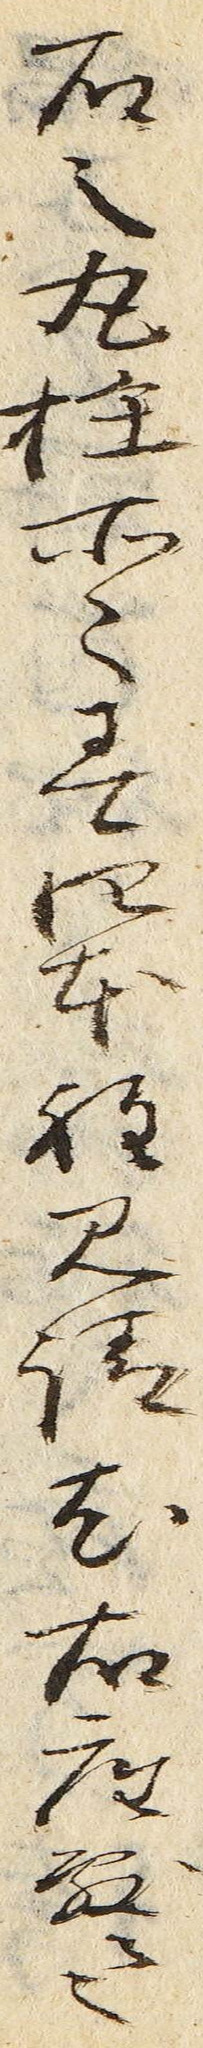石之丸柱所々にて四本程見請尤右座敷々々
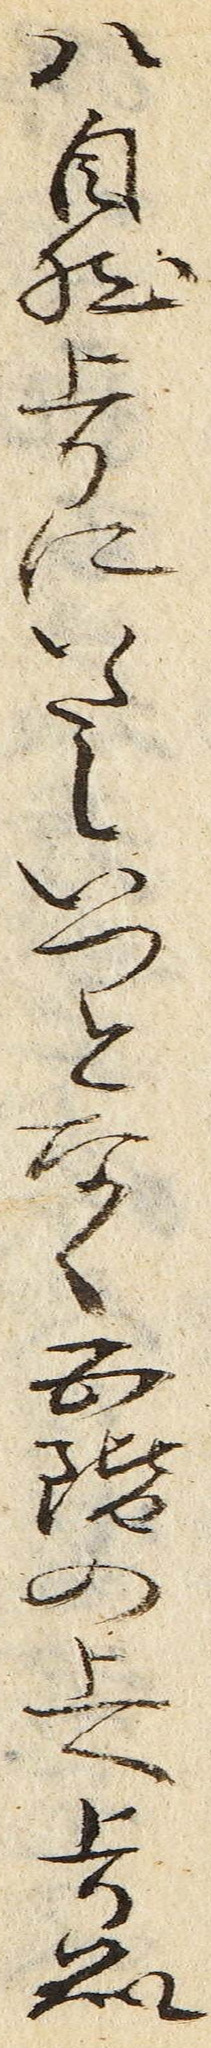は自然上りにいたしいつとなく五階の上へ上り候処
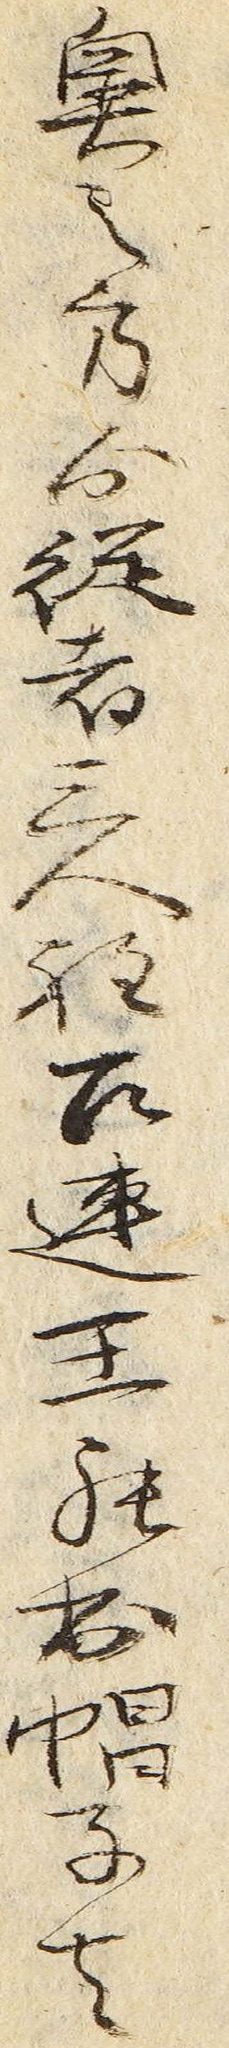奥之方ゟ従者三人程召連王罷出帽子は
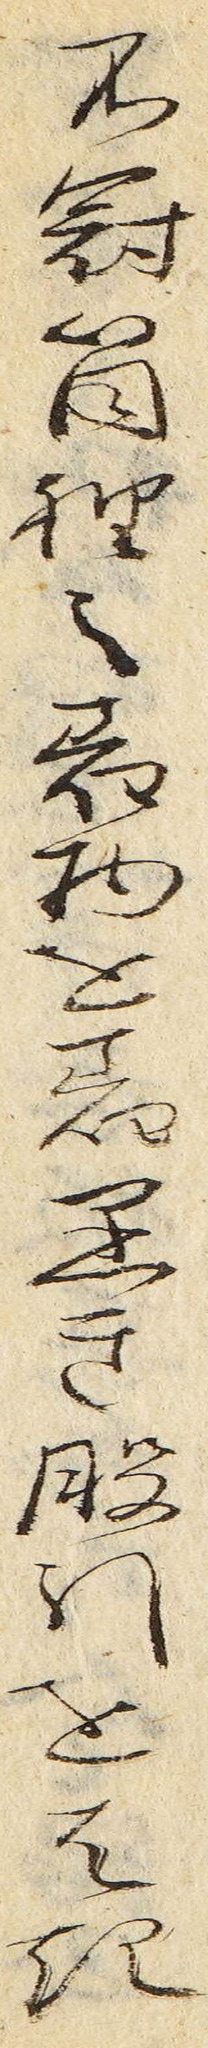不冠筒袖之着物を着黒き股引をはき

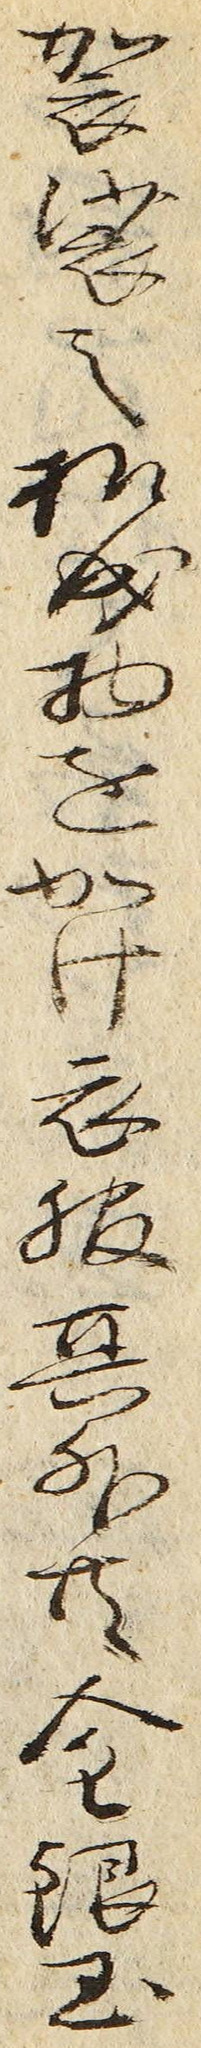袈裟之様成物をかけ衣服其外共金銀玉
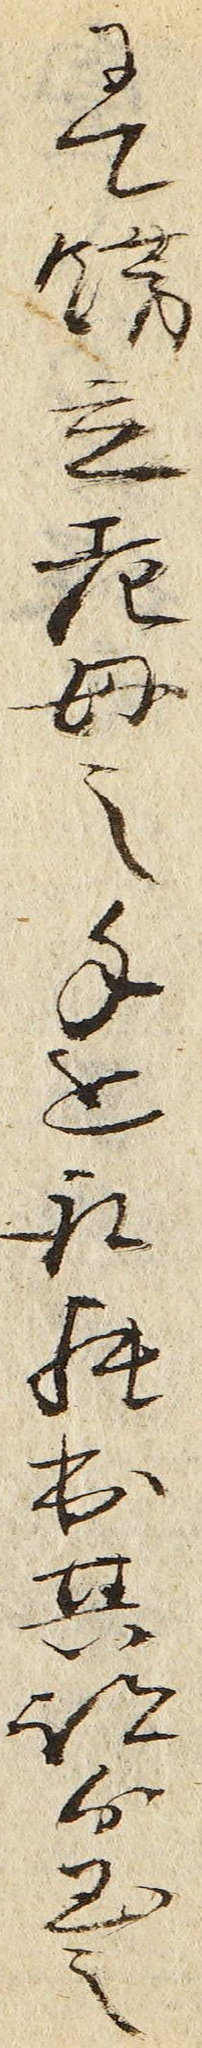にて餝立老母之手を取罷出其跡ゟ王之
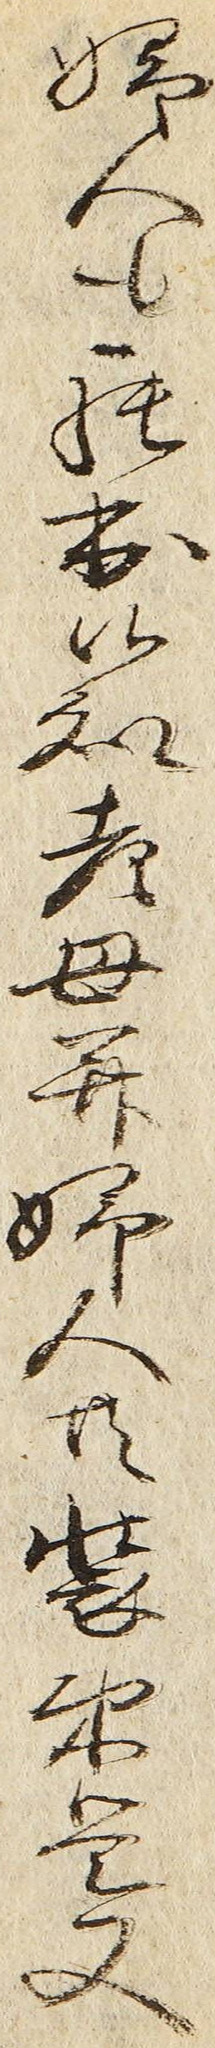婦人も罷出候処老母并婦人共装束是又
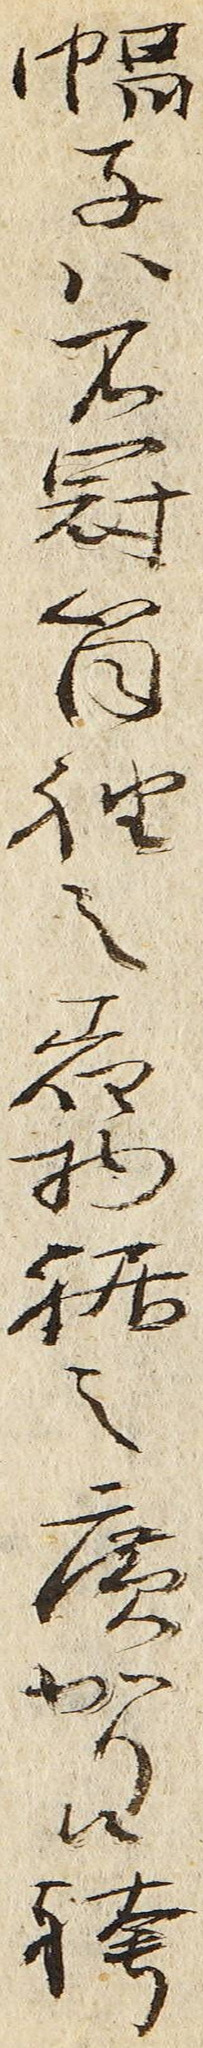帽子は不冠筒袖之着物裾之広かり候袴
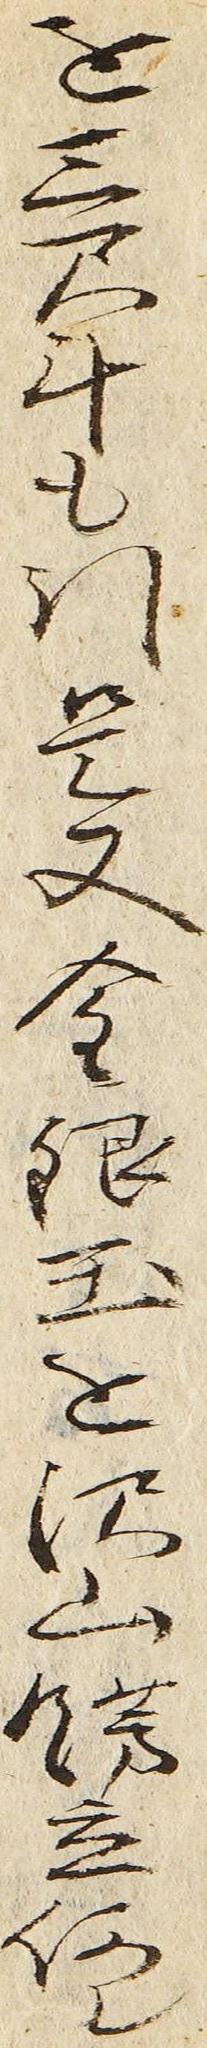を三尺斗も引是又金銀玉を沢山餝立何レ
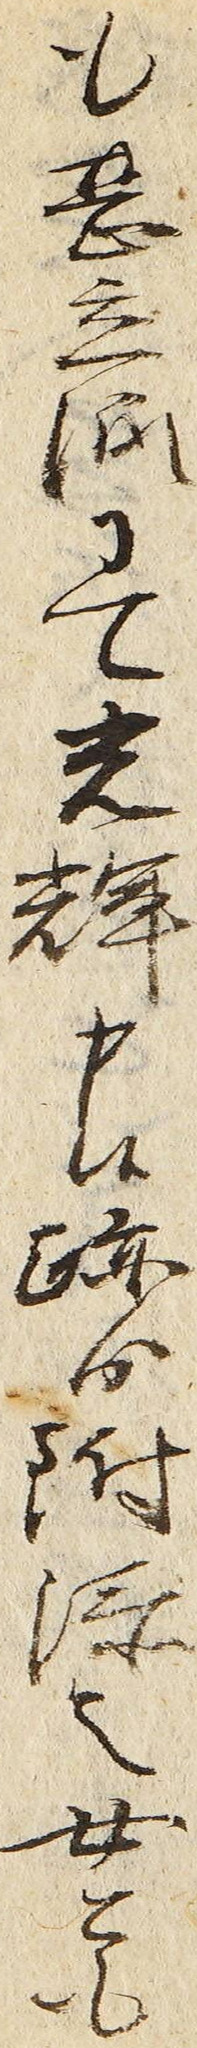も甚立派にて光輝申候跡ゟ附添之女とも
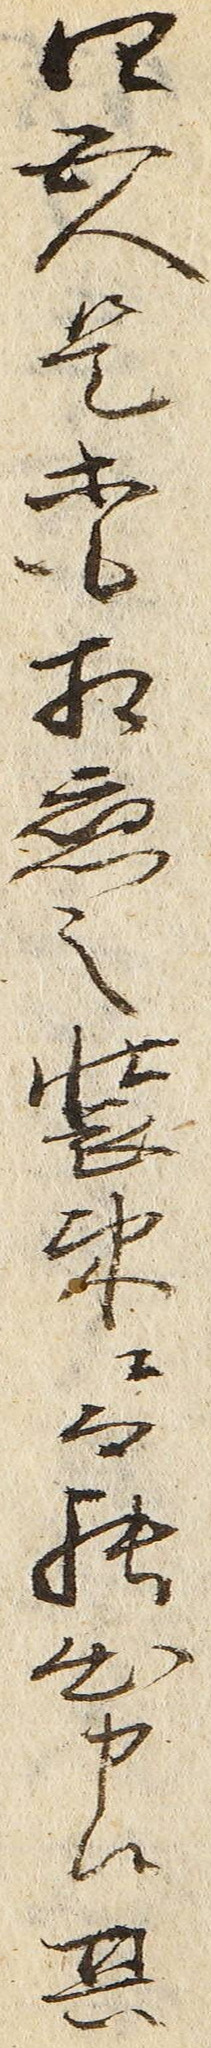四五人是等も相応之装束にて罷出申候其
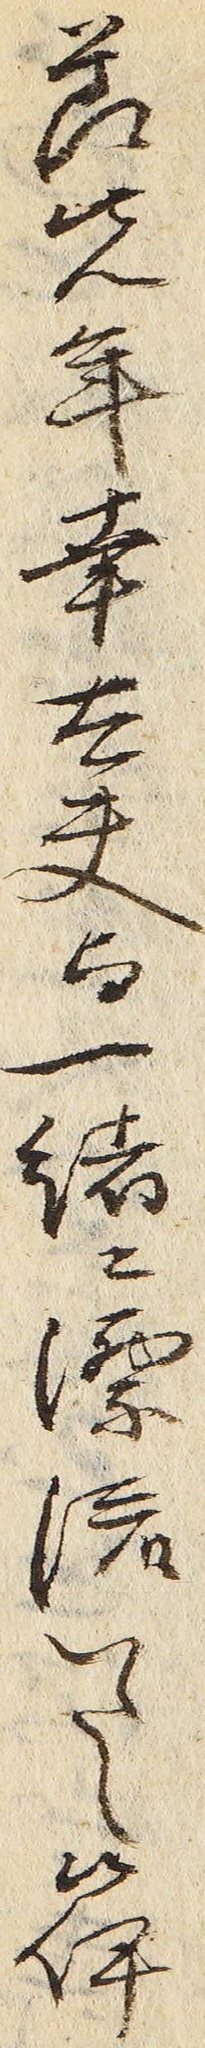節先年幸太夫と一緒に漂流いたし候伊
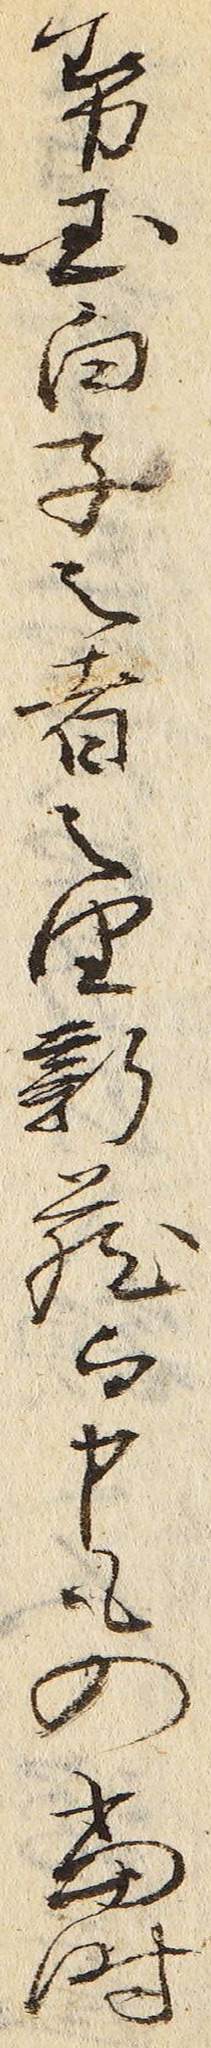勢国白子之者之由新蔵と申もの当時
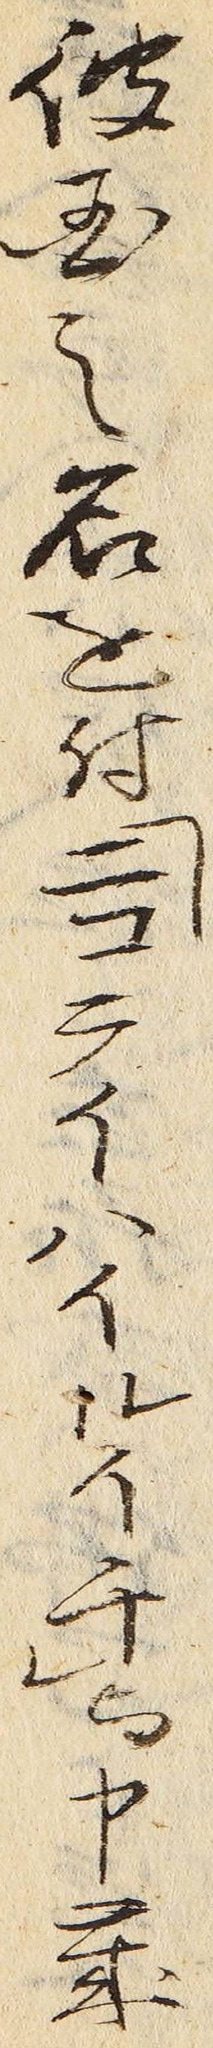彼国之名を付「ニコライハイルイチ」と申歳
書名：漂民後記
